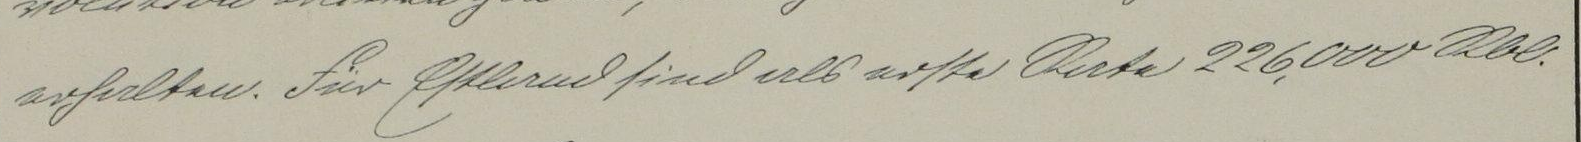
erhalten. Für Estland sind als erste Rate 226,000 Rbl.
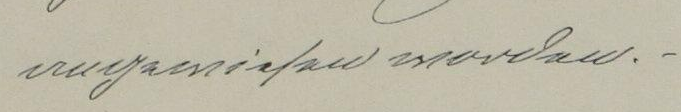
angewiesen worden.
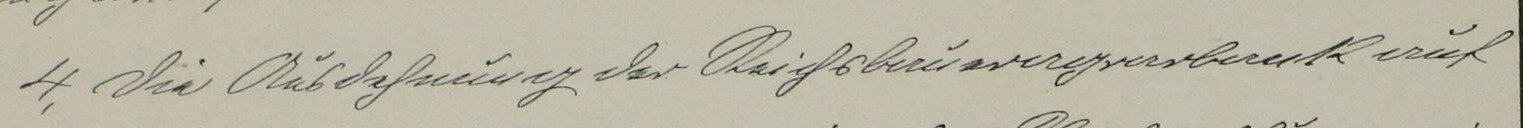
4. Die Ausdehnung der Reichsbaueragrarbank auf
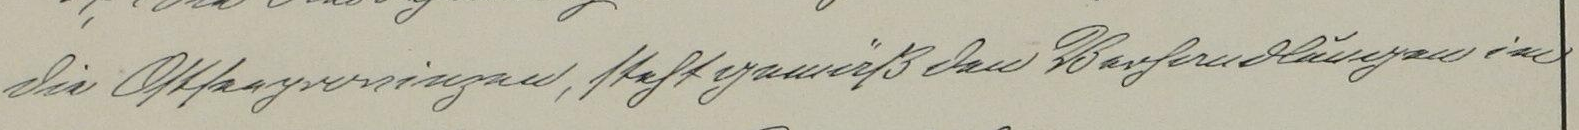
die Ostseeprovinzen steht gemäß den Verhandlungen im
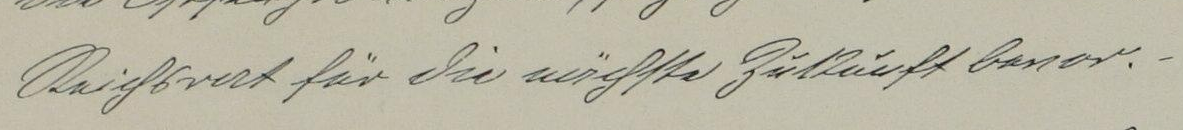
Reichsrat für die nächste Zukunft bevor.
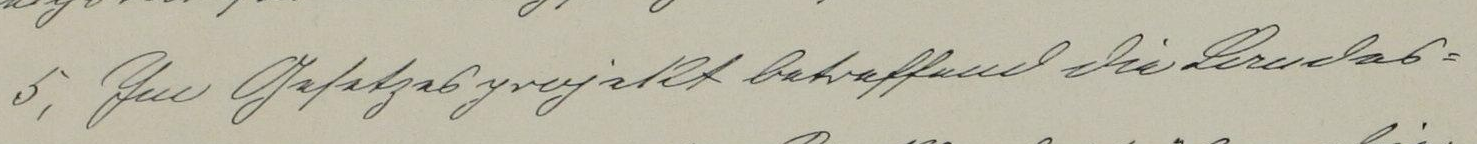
5. Im Gesetzesprojekt betreffend die Landes-
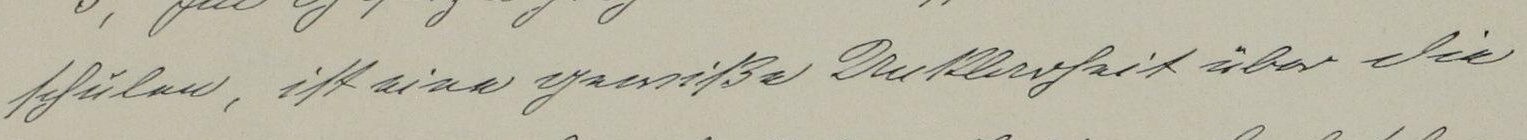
schulen, ist eine gewiße Unklarheit über die
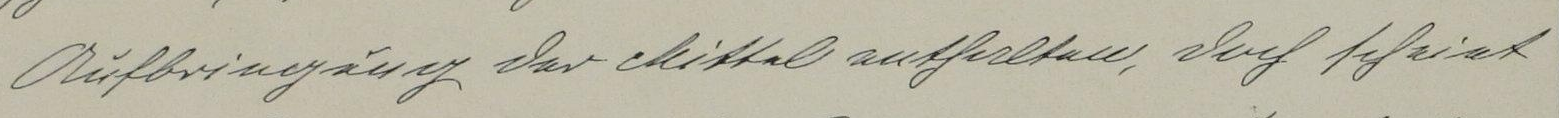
Aufbringung der Mittel enthalten, doch scheint
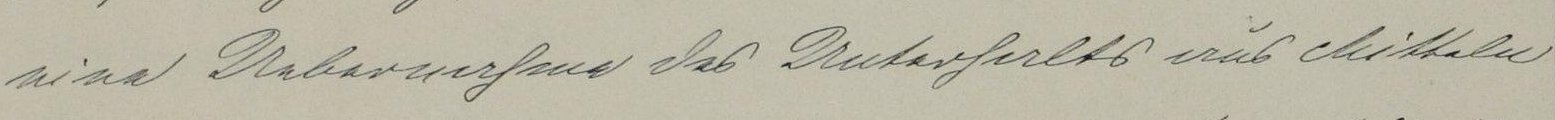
eine Uebernahme des Unterhalts aus Mitteln
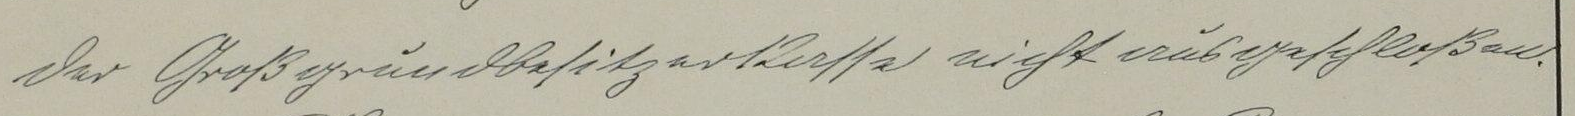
der Großgrundbesitzerkasse nicht ausgeschlossen.
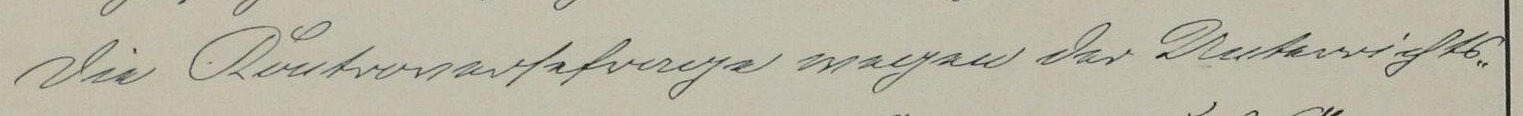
Die Kontroversefrage wegen der Unterrichts-
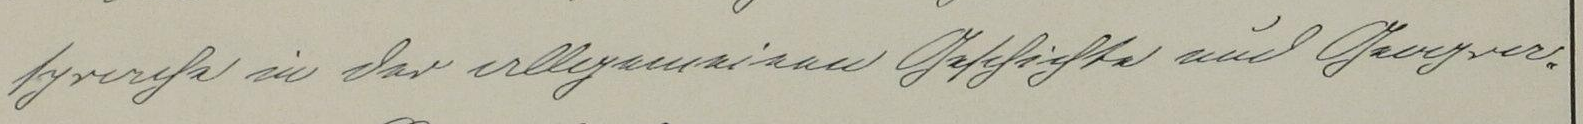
sprache in der allgemeinen Geschichte und Geogra-
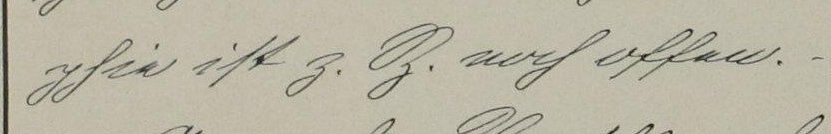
phie ist z.Z. noch offen.
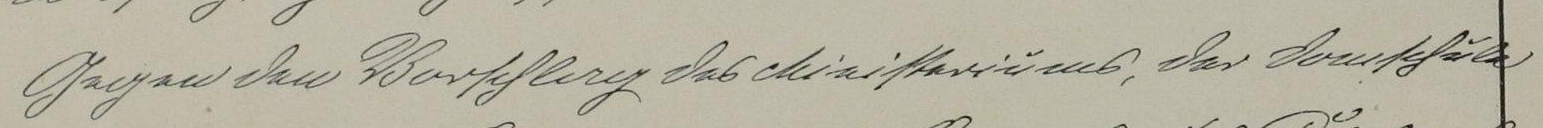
Gegen den Vorschlag des Ministeriums, der Domschule
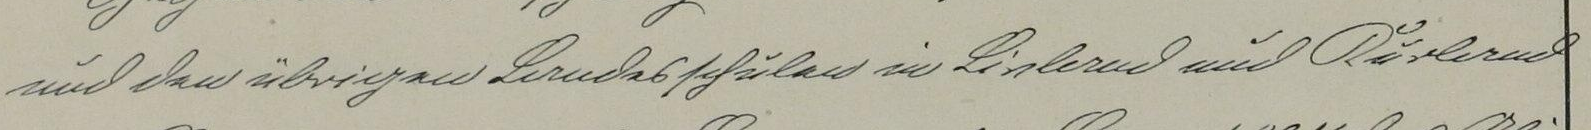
und den übrigen Landesschulen in Livland und Kurland
